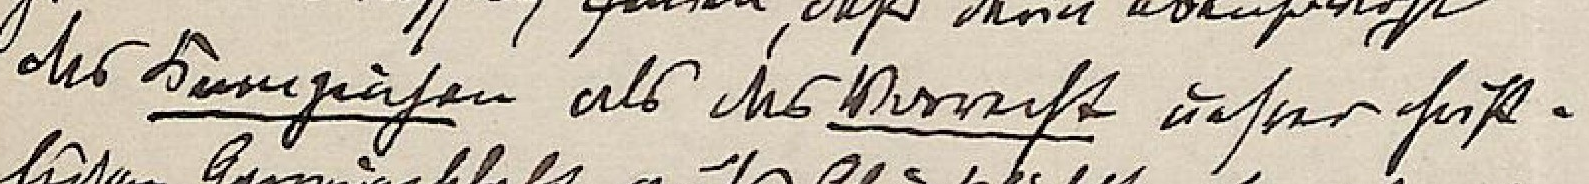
das Kennzeichen als das Vorrecht unsrer christ¬
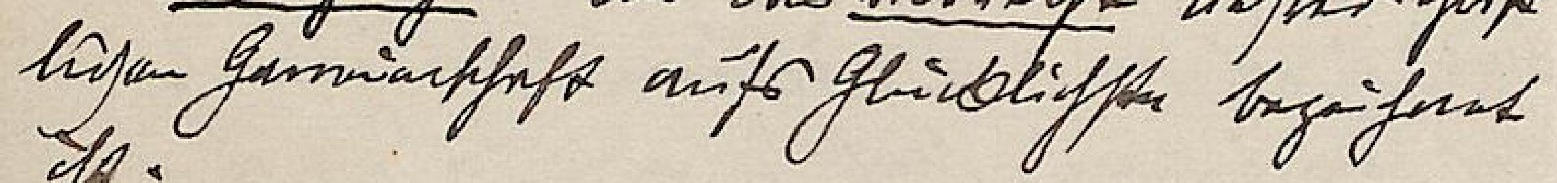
lichen Gemeinschaft aufs Göücklichste bezeichnet
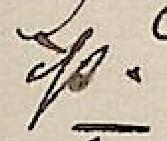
ist
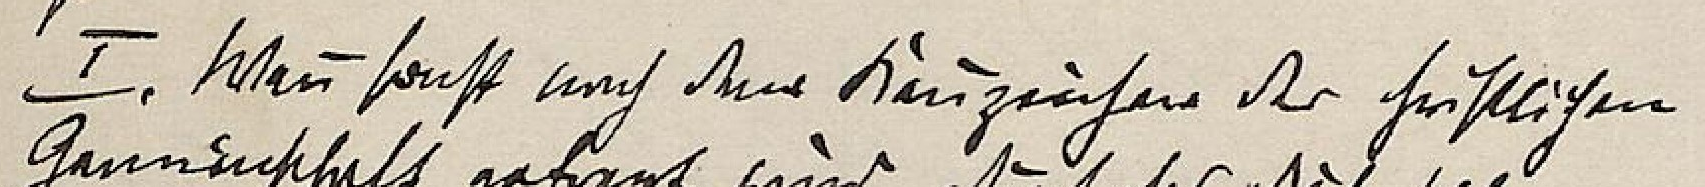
I. Wen sonst nach dem Kenzeichen der christlichen
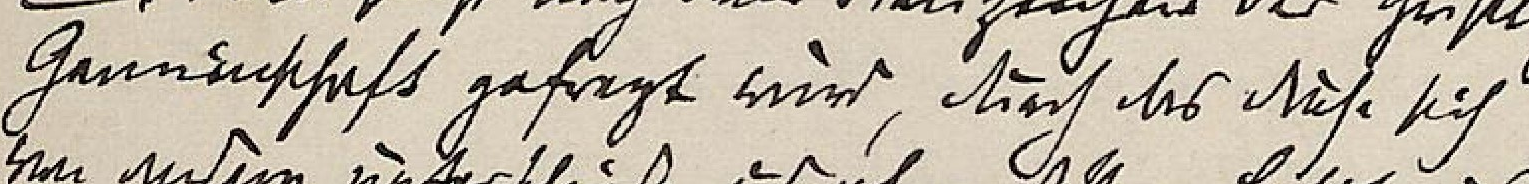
Gemeinschaft gefragt wird, durch das diese sich
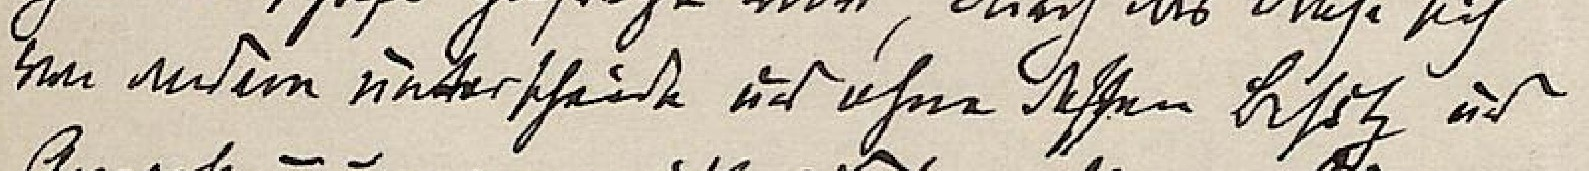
von andere unterscheide und ohne dessen Besitz und
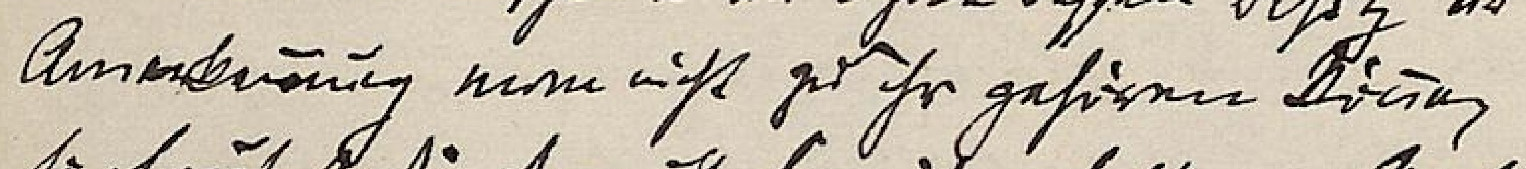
Anerkenung man nicht zu ihr gehören köne,
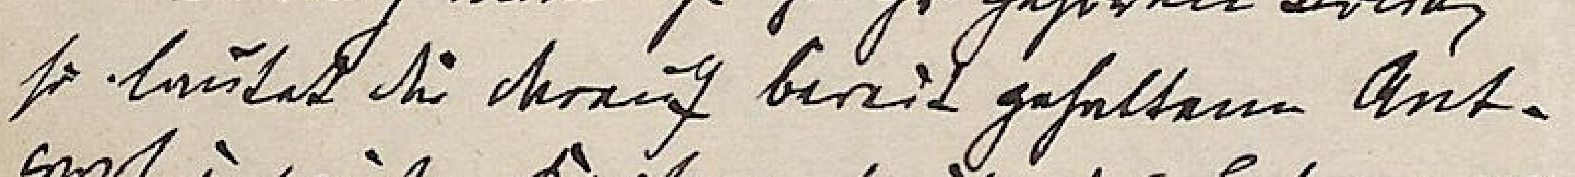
so lautet die darauf bereit gehaltene Ant¬
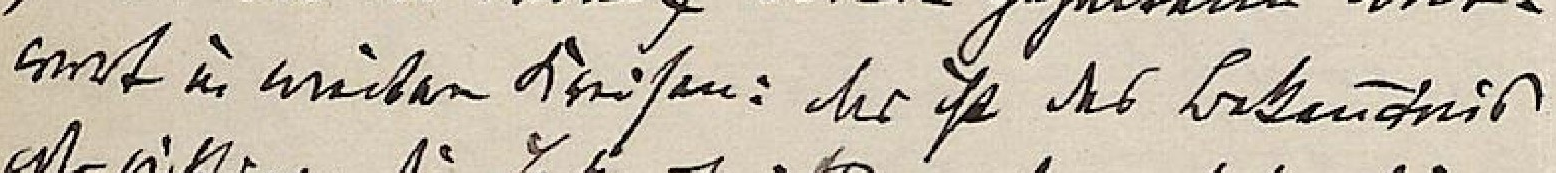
wort in weiten Kreisen: das ist das Bekenntnis
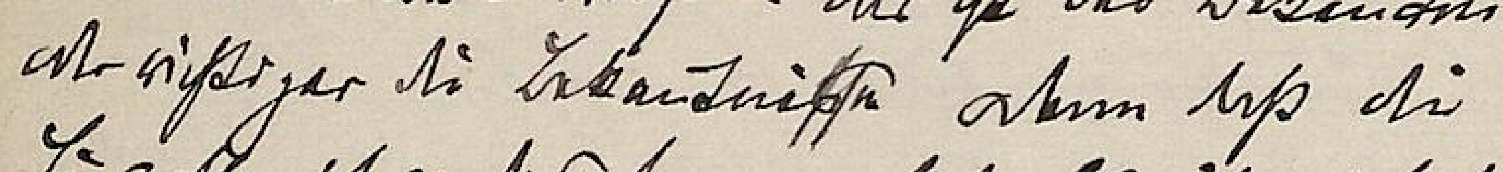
oder richtiger die Bekenntnisse. Denn daß die
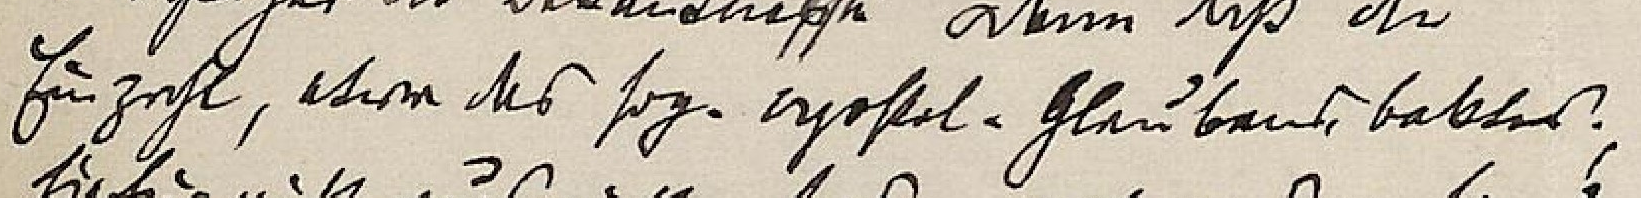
Einzahlt, etwa des sog. apostol. Glaubensbektns.
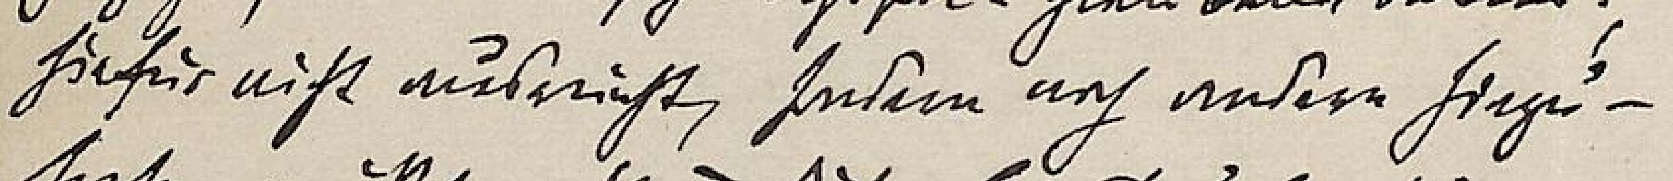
hierfür nicht ausreicht, sondern noch andere hinzu¬
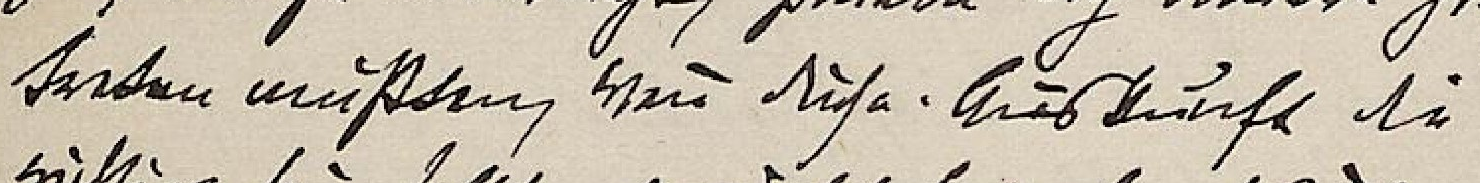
treten müßten, wen diese Auskunft die
